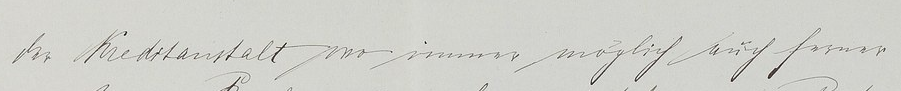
der Kreditanstalt wo immer möglich auch ferner
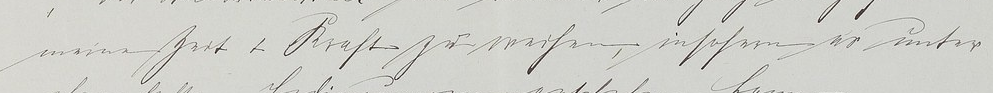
meine Zeit & Kraft zu weihen, insofern es unter
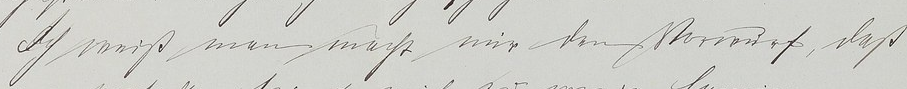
Ich weiß man macht mir den Vorwurf, daß
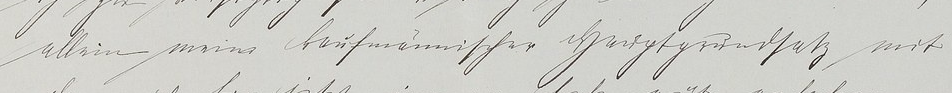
allein mein kaufmännischer Hauptgrundsatz mit
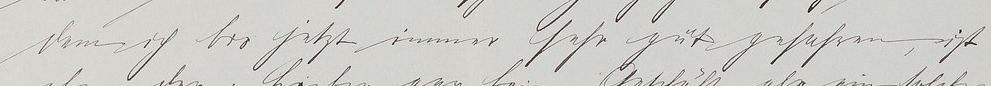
dem ich bis jetzt immer sehr gut gefahren, ist
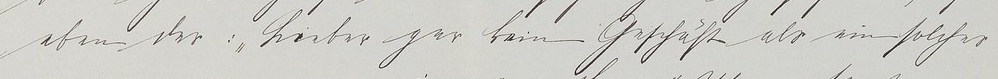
eben der: «Lieber gar kein Geschäft als ein solches
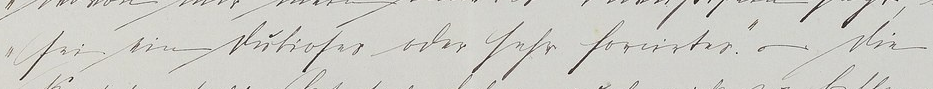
sei ein dubioses oder sehr forcirtes». – Die
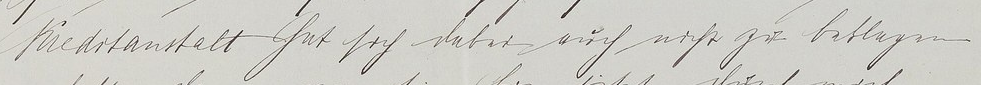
Kreditanstalt hat sich dabei auch nicht zu beklagen
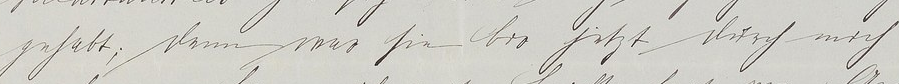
gehabt; denn was sie bis jetzt durch mich
